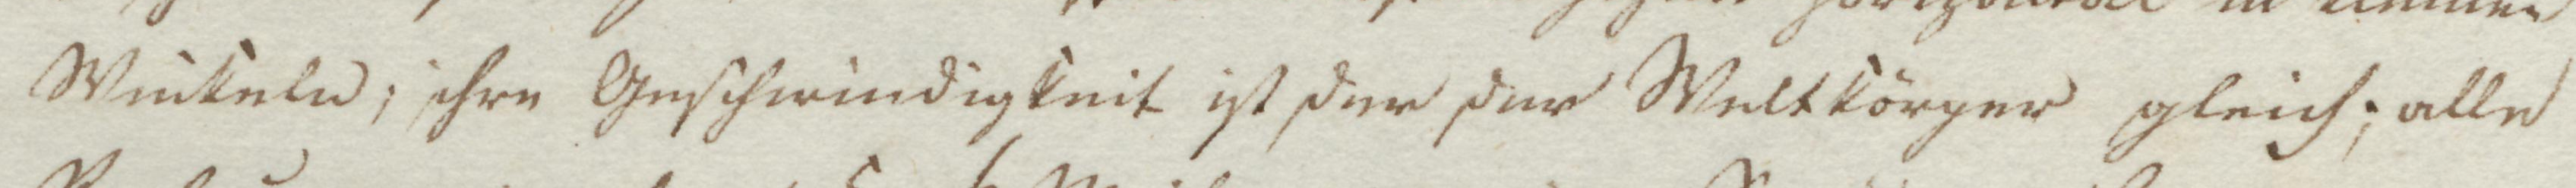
Winkeln; ihre Geschwindigkeit ist der der Weltkörper gleich; alle
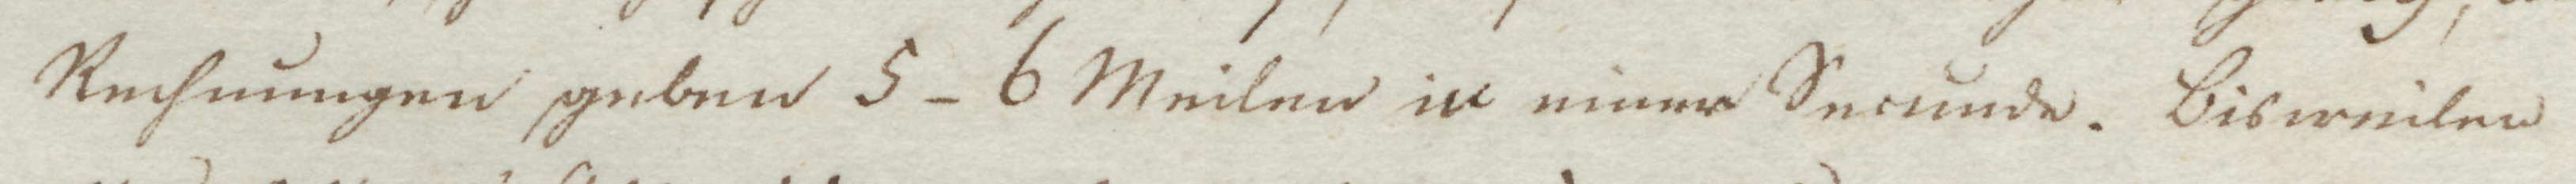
Rechnungen geben 5–6 Meilen in einer Secunde. Bisweilen
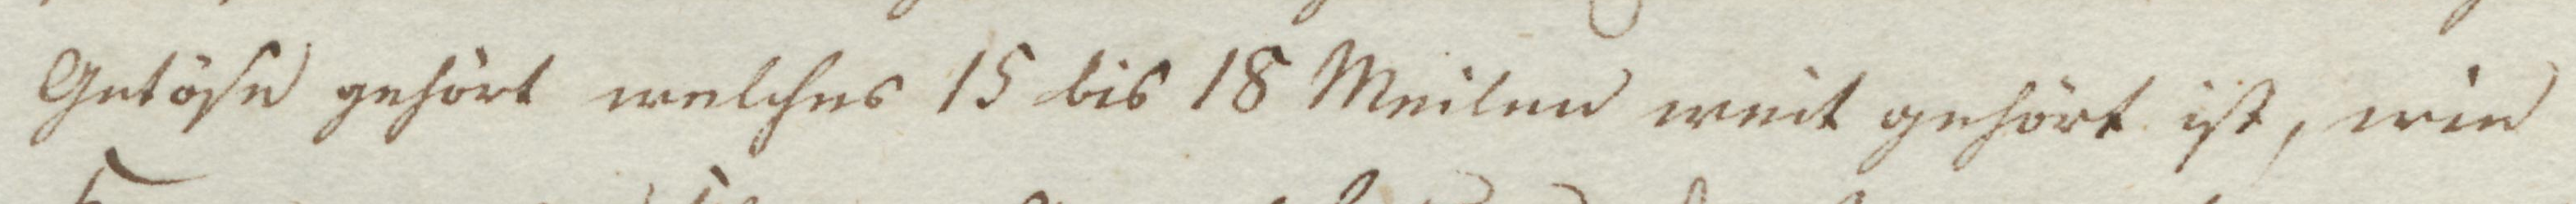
Getöse gehört welches 15 bis 18 Meilen weit gehört ist, wie
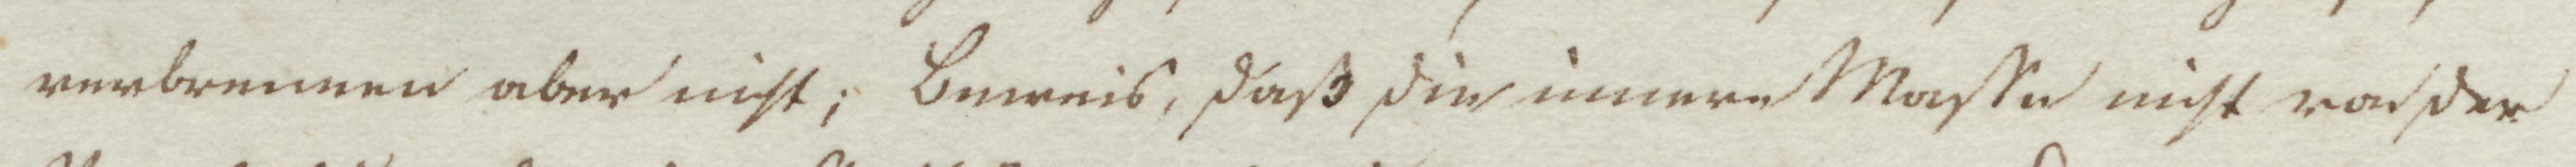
verbrennen aber nicht; Beweis, daß die innere Masse nicht von der
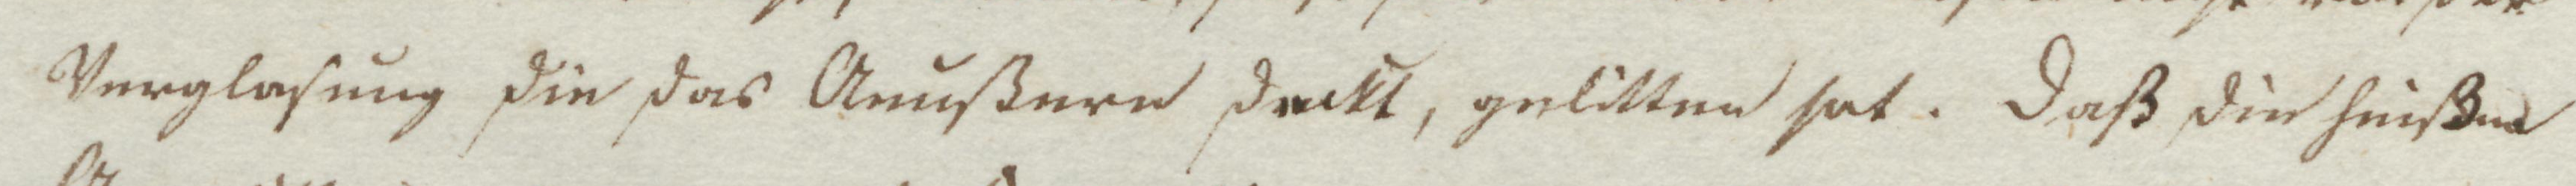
Verglasung die das Aeußere deckt, gelitten hat. Daß die heißen
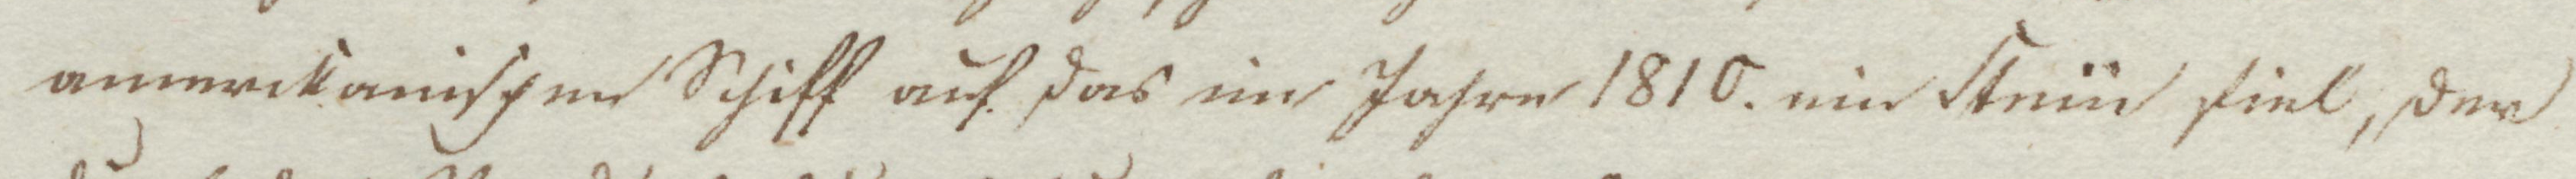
amerikanischen Schiff auf das im Jahre 1810. ein Stein fiel, der
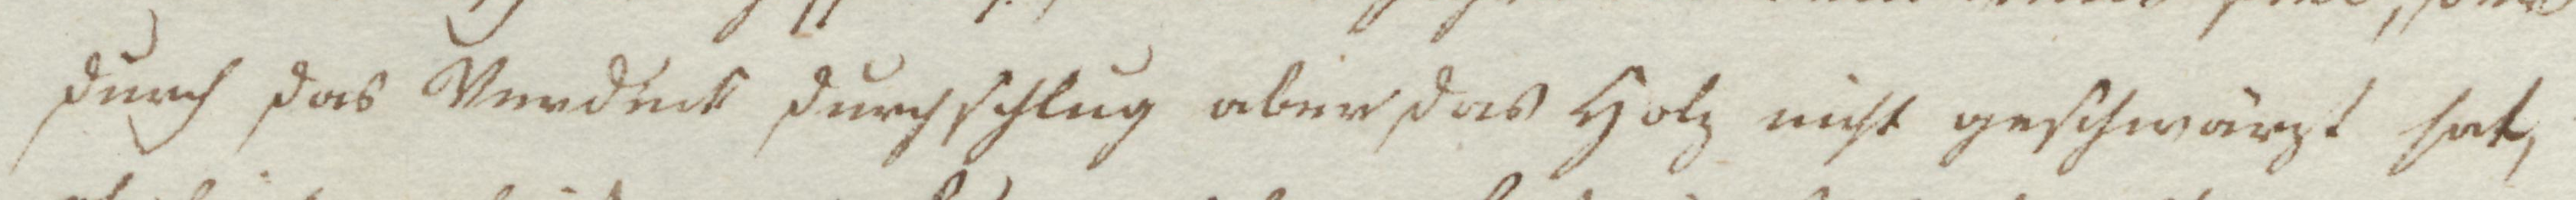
durch das Verdeck durchschlug aber das Holz nicht geschwärzt hat,
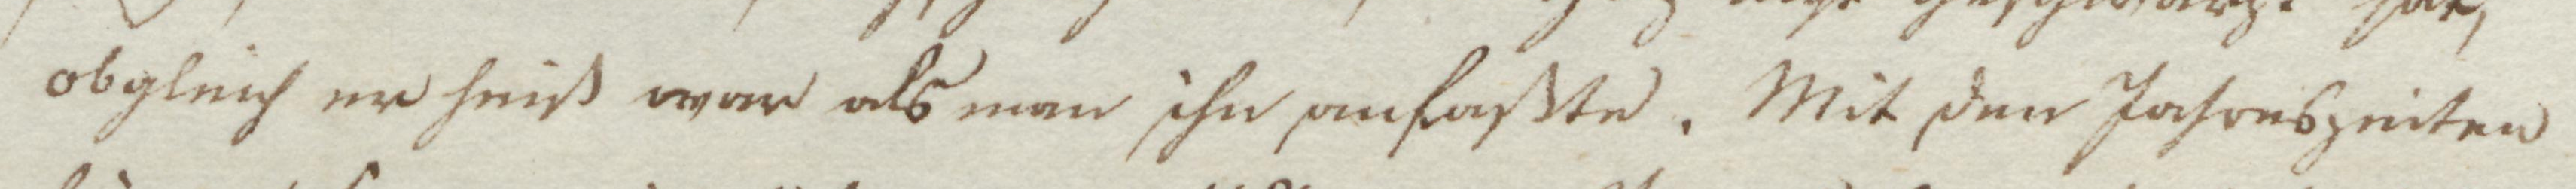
obgleich er heiß war als man ihn anfaßte. Mit den Jahreszeiten
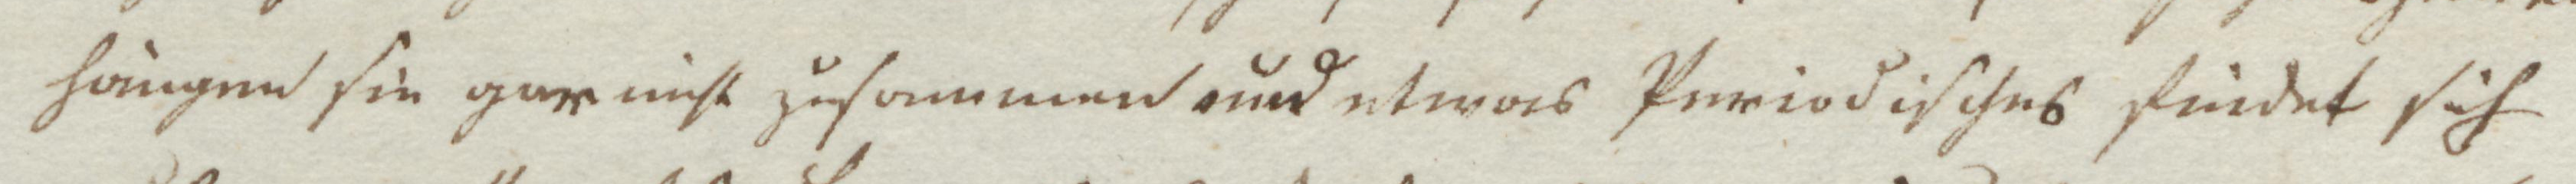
hängen sie gar nicht zusammen u.und etwas Periodisches findet sich
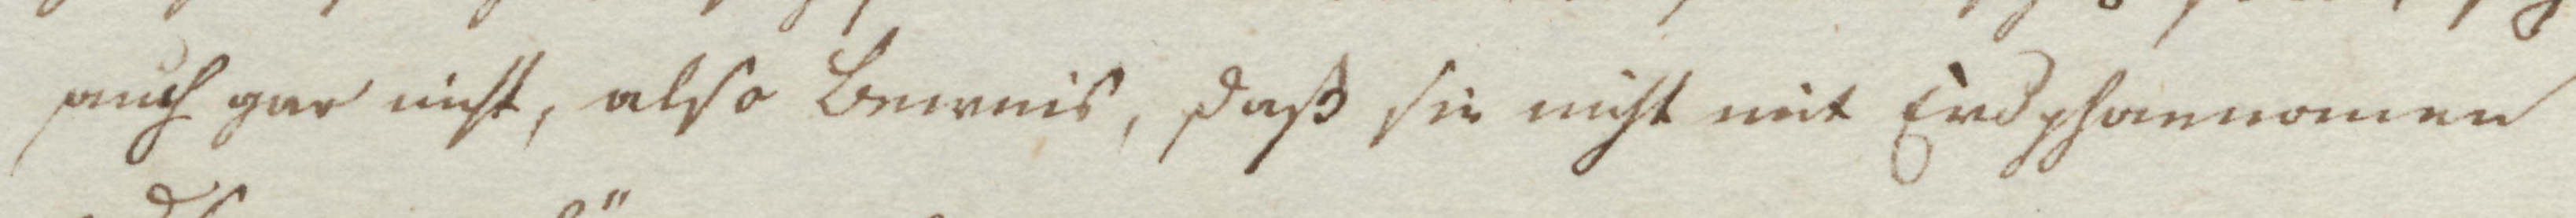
auch gar nicht, also Beweis, daß sie nicht mit Erdphaenomen
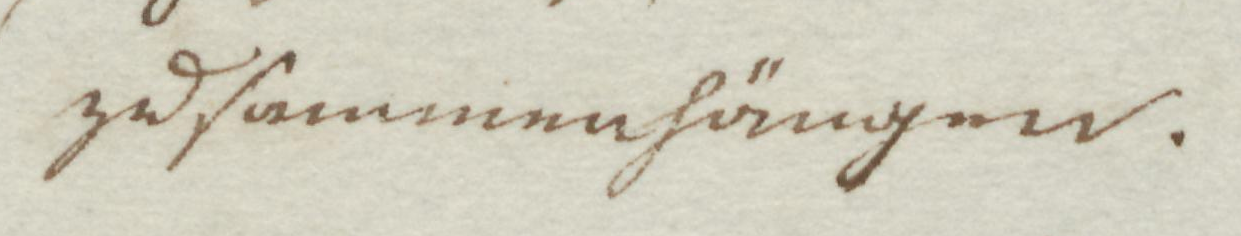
zusammenhängen.
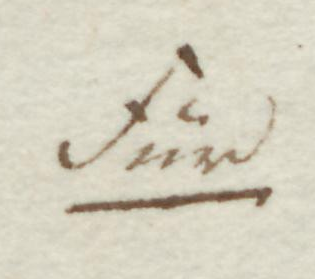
meint.
